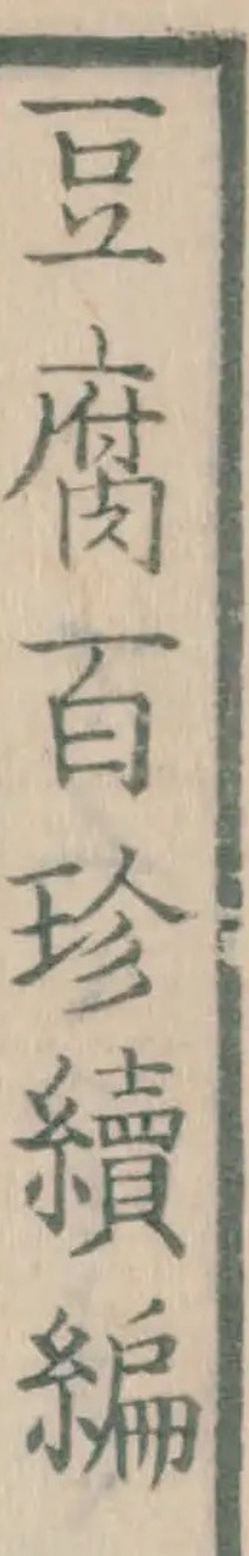豆腐百珍続編
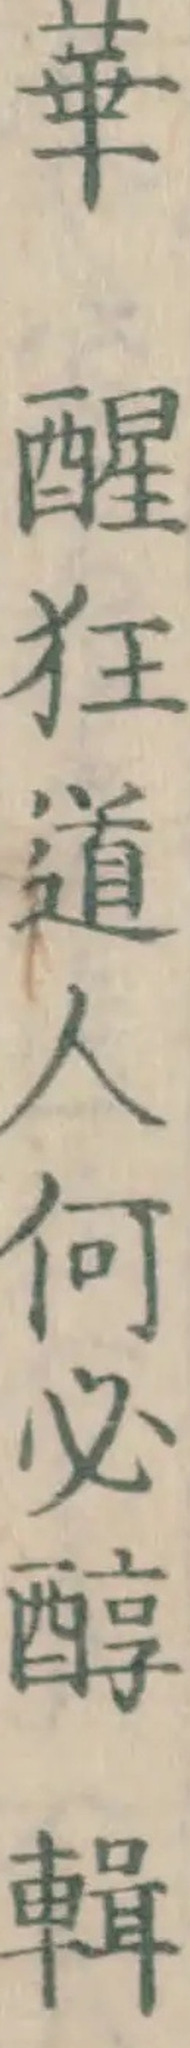浪華醒狂道人何必醇輯
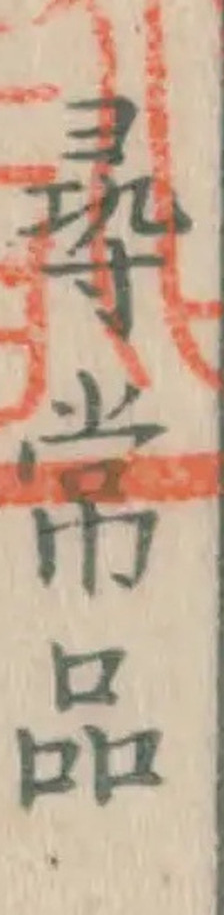尋常品
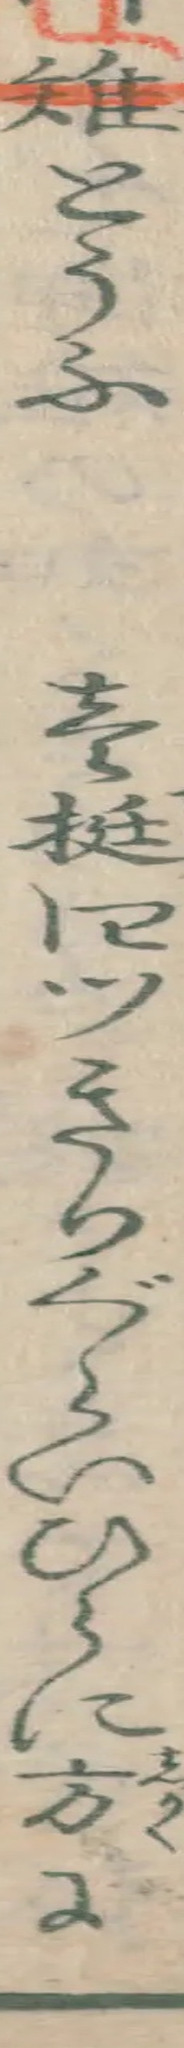一御雉とうふ壱挺四つきりぐらいひらに方に
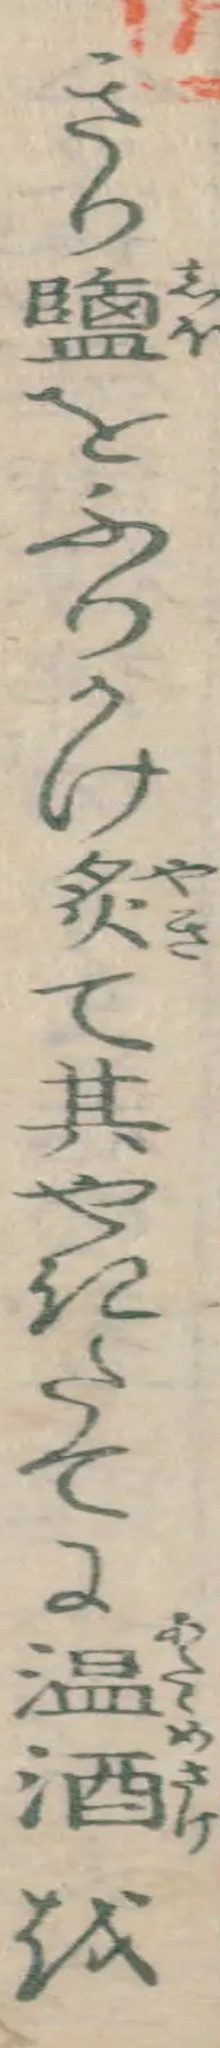きり塩をふりかけ炙て其やきたてに温酒を
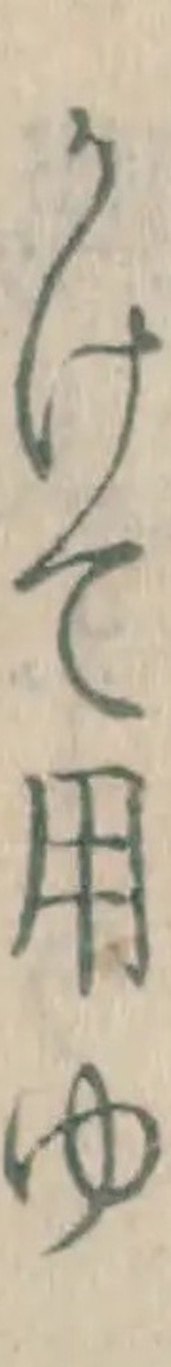かけて用ゆ
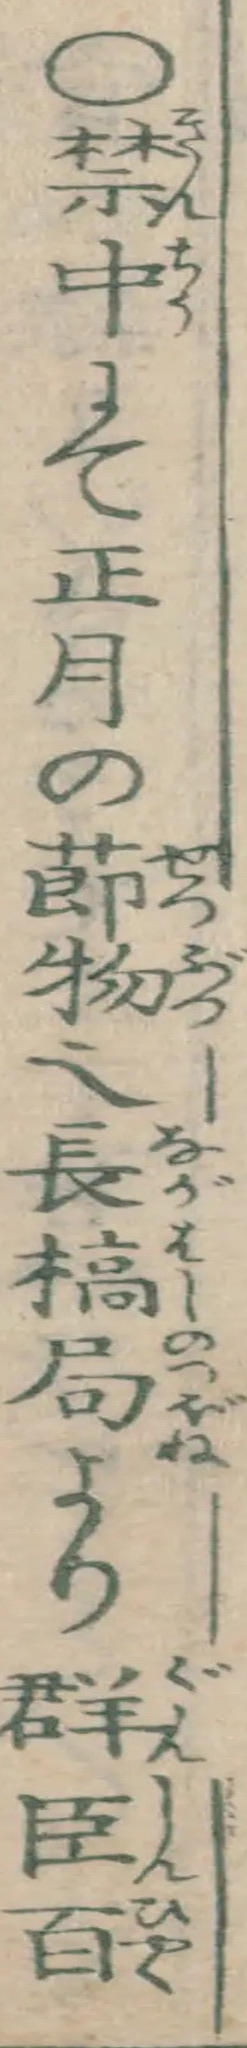○禁中にて正月の節物也長橋局より群臣百

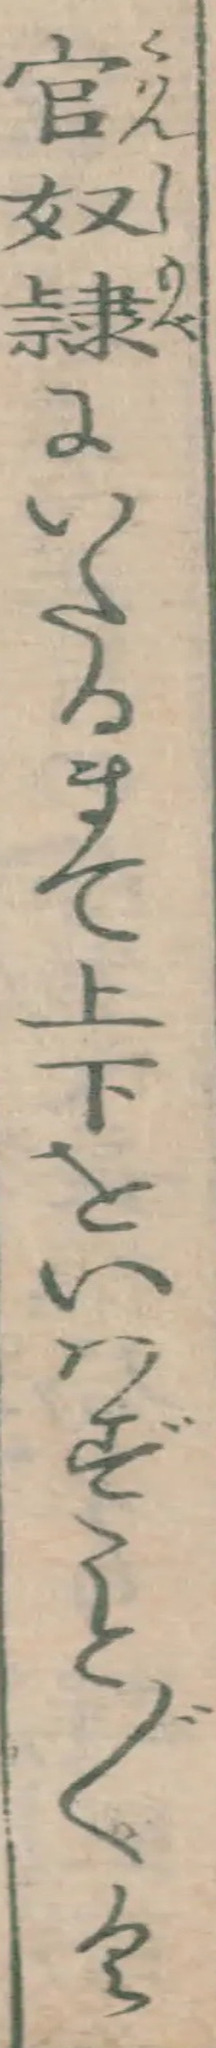官奴隷にいたるまて上下をいはずこと〳〵く
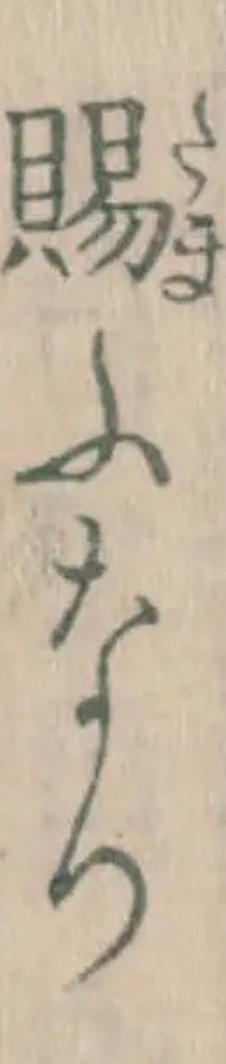賜ふなり
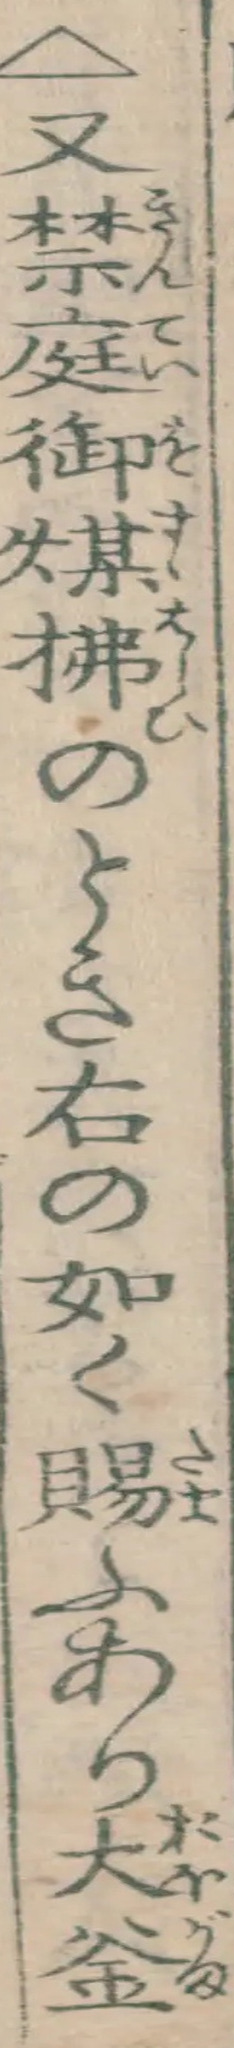△又禁庭御煤払のとき右の如く賜ふあり大釜
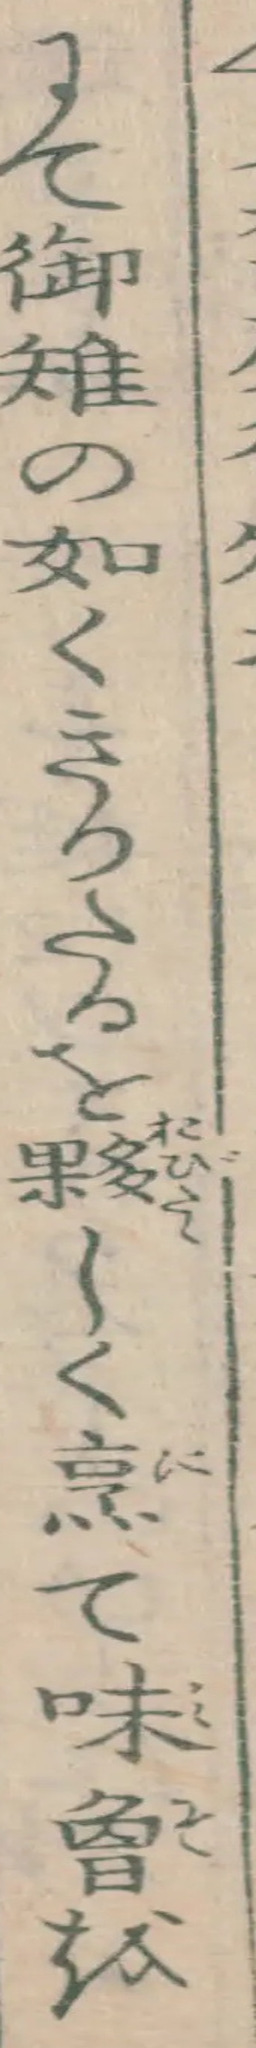にて御雉の如くきりたるを夥しく烹て味曽を
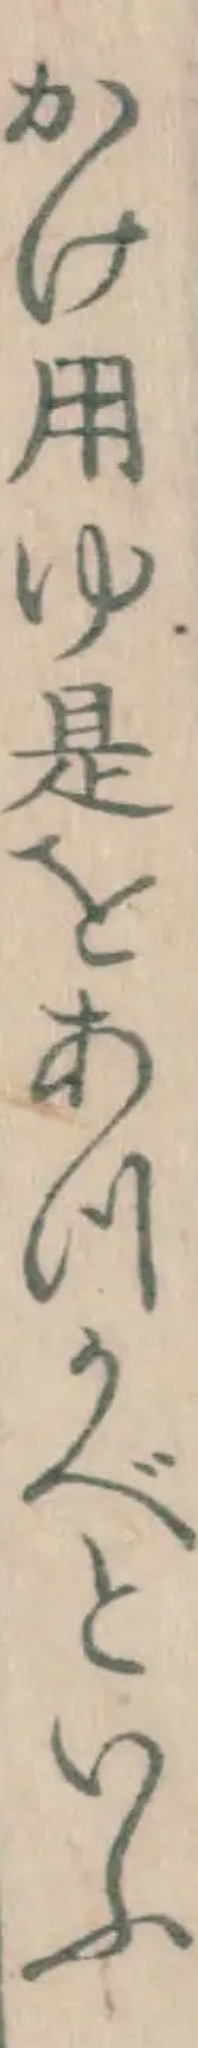かけ用ゆ是をあつかべといふ
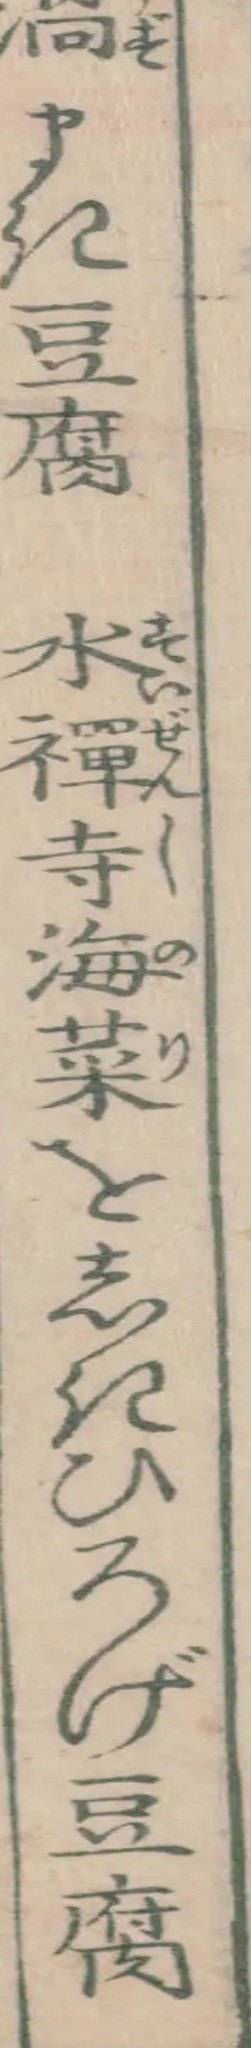二渦まき豆腐水禅寺海菜をしきひろげ豆腐
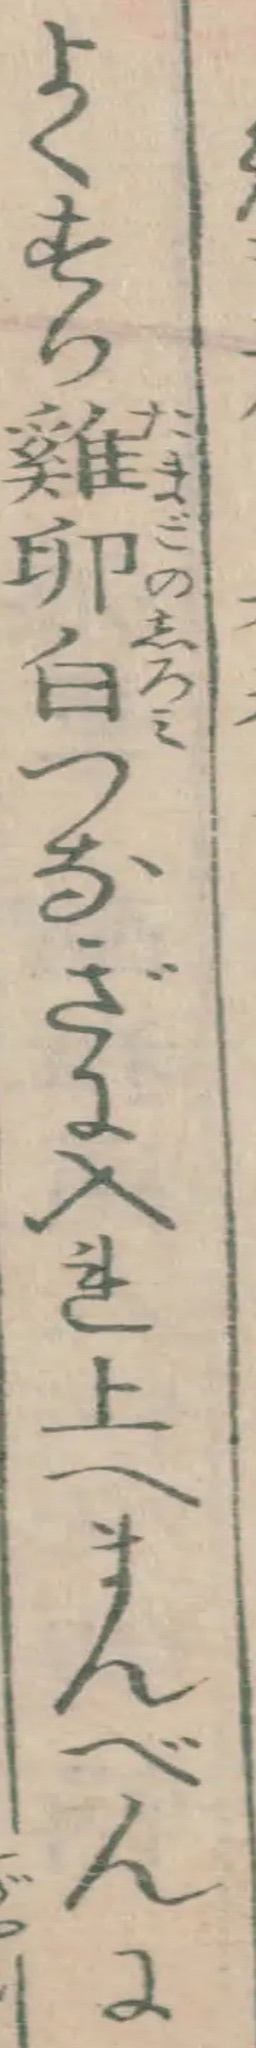よくすり鶏卵白つなぎに入れ上へまんべんに
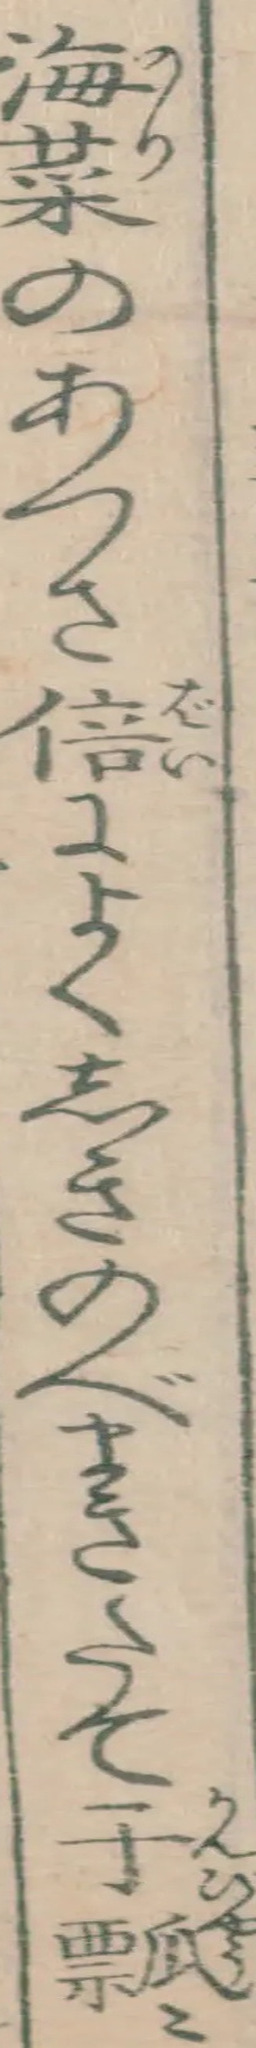海菜のあつさ倍によくしきのべまきたて干瓢に
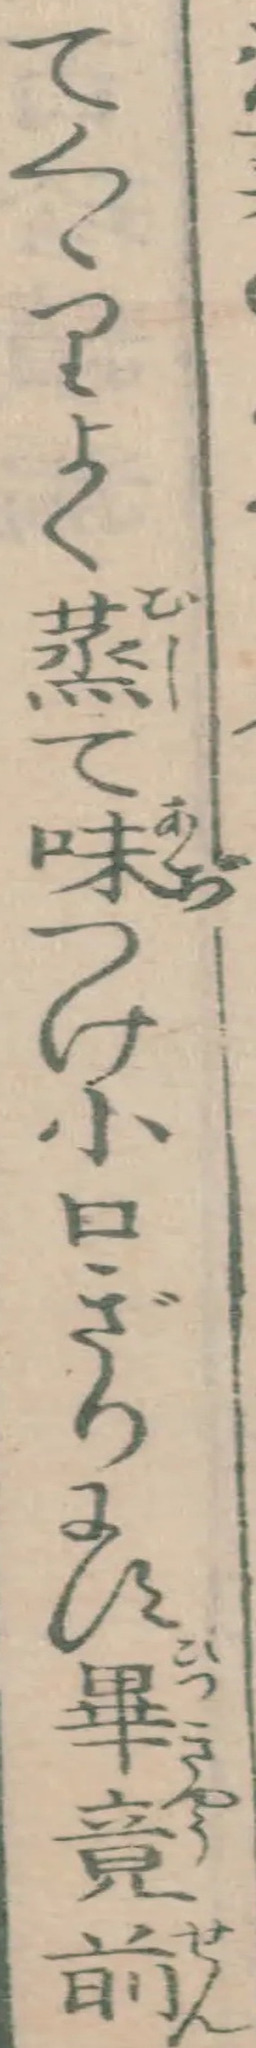てくゝりよく蒸て味つけ小口ぎりにす畢竟前
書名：豆腐百珍. 続編
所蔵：国立国会図書館 National Diet Library, JAPAN
